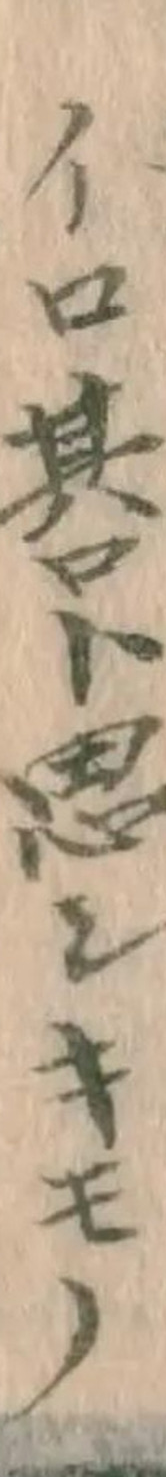イロ其口ト思シキモノ
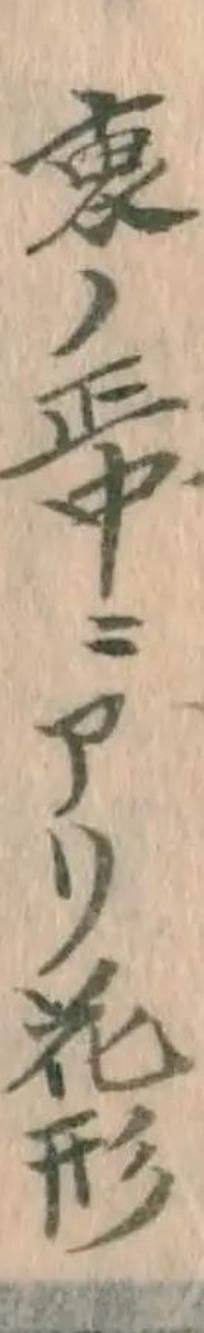裏ノ正中ニアリ花形
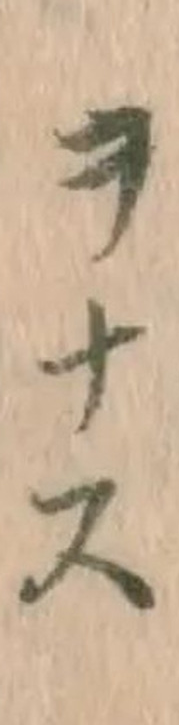ヲナス
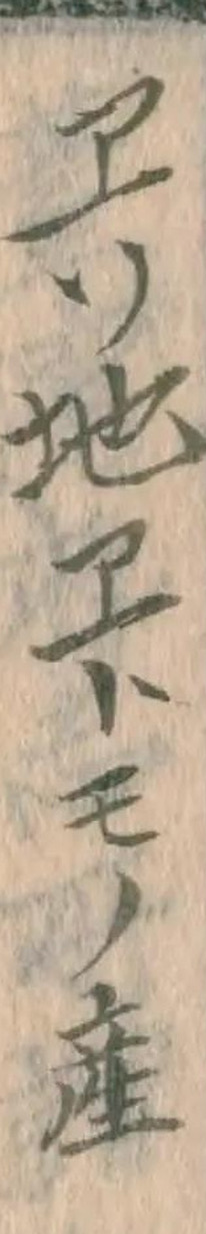ヱソ地ヱトモノ産
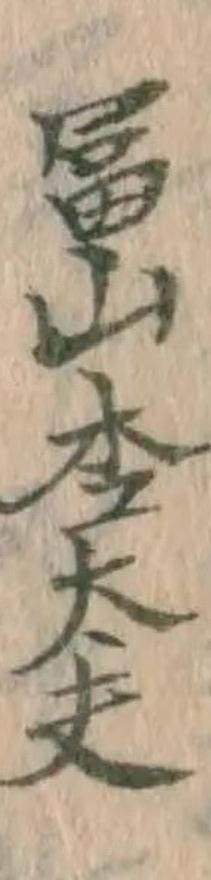富山杢太夫
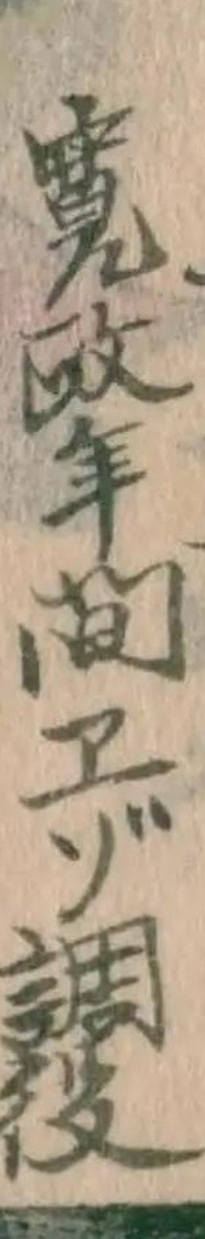寛政年間ヱゾ調役
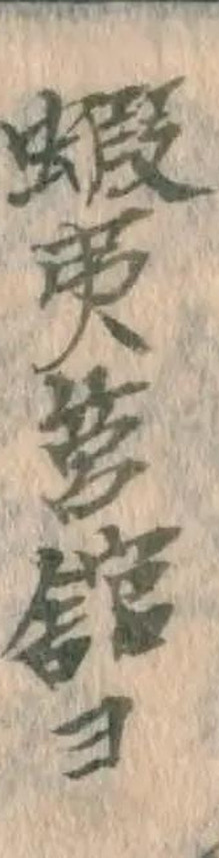蝦夷筥館ヨ
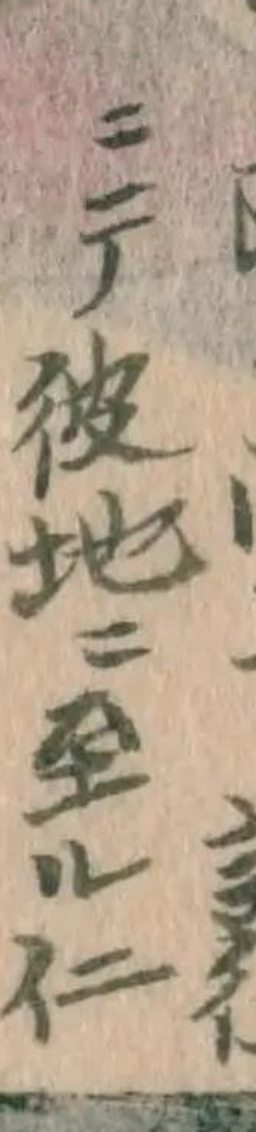ニテ彼地ニ至ル仁
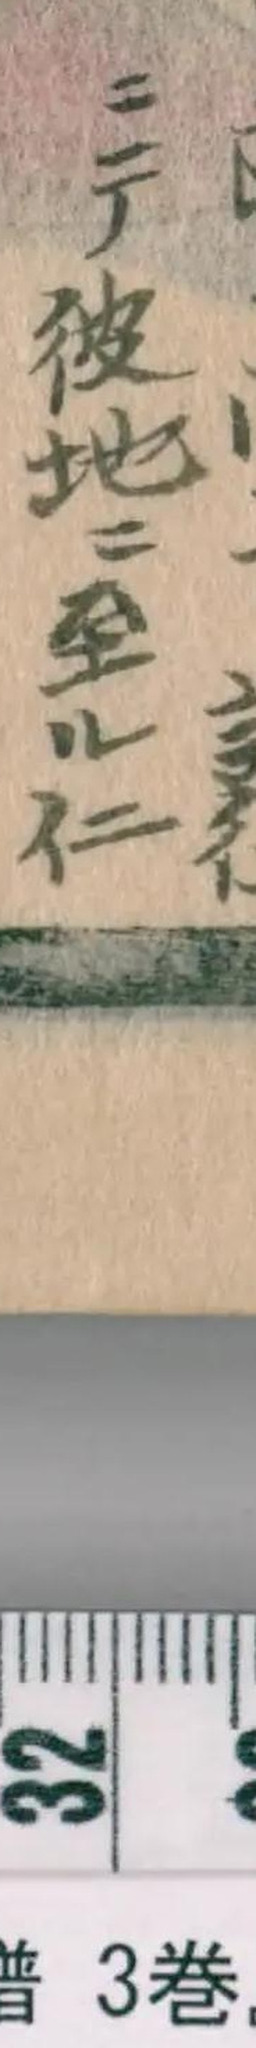ニテ彼地ニ至ル仁
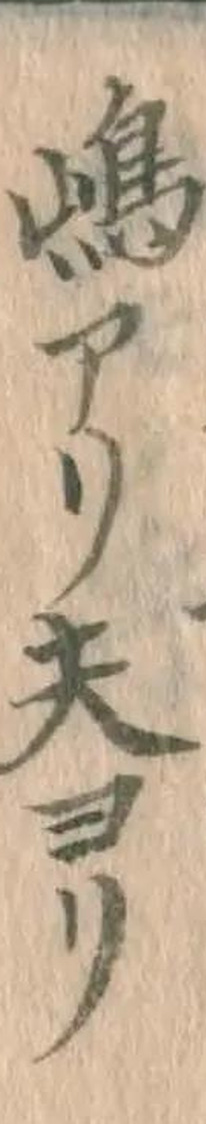嶋アリ夫ヨリ
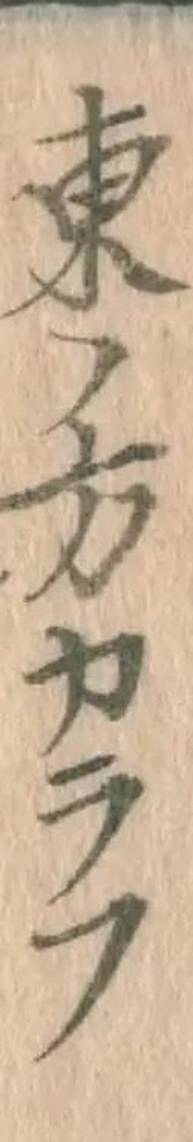東ノ方カラフ
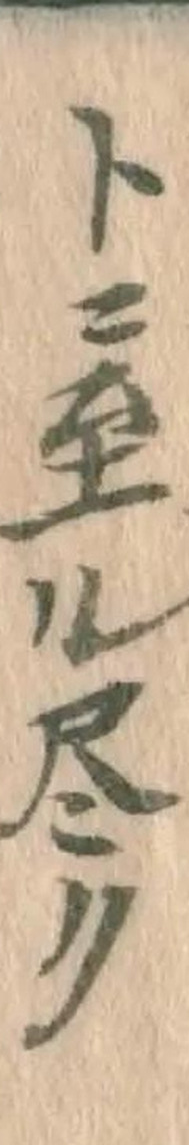ト二至ル尽ク
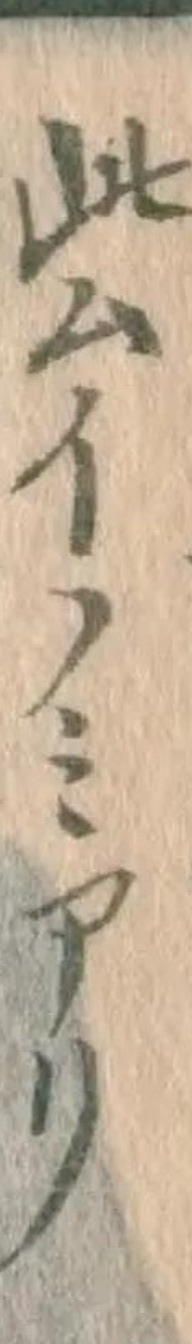此ムイノミアリ
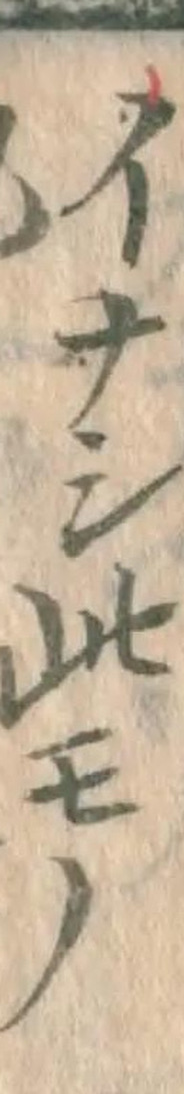-イナシ此モノ
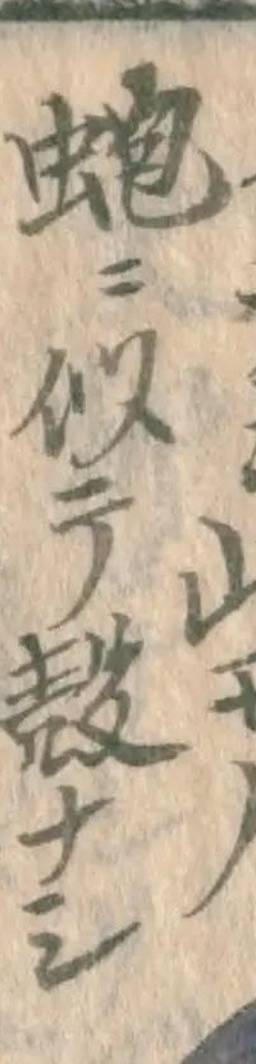蚫ニ似テ殻ナシ
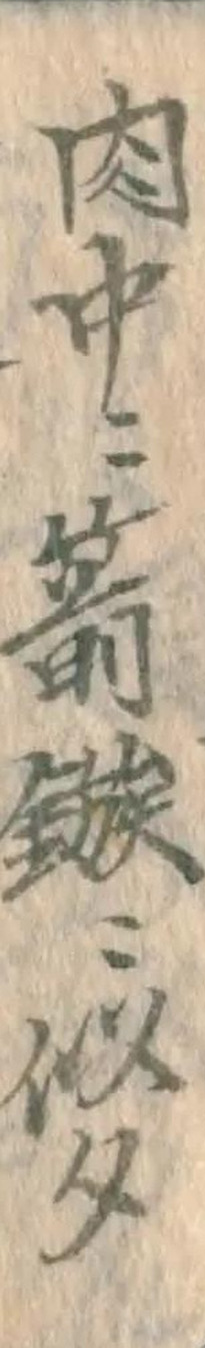肉中ニ箭鏃ニ似タ
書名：千蟲譜 3巻. [3]
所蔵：国立国会図書館 National Diet Library, JAPAN
